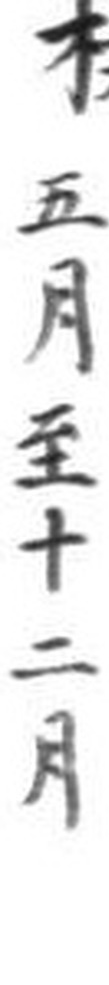五月至十二月

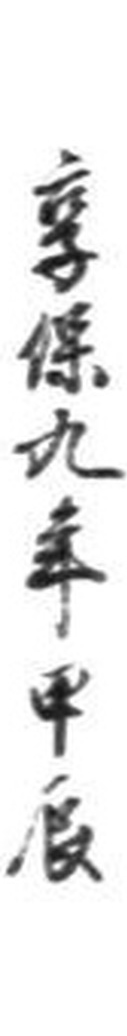享保九年甲辰
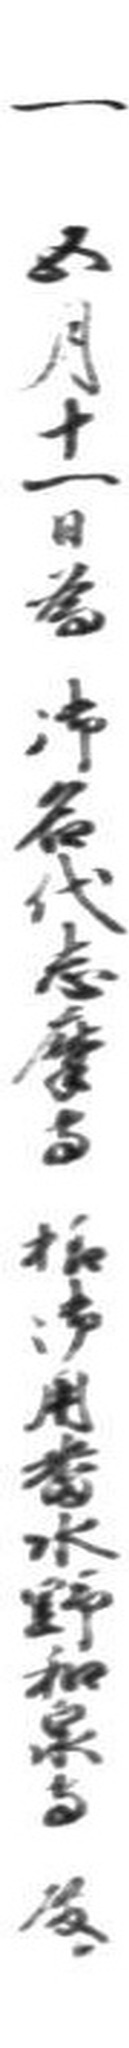一五月十一日為御名代志摩守様御用番水野和泉守殿江
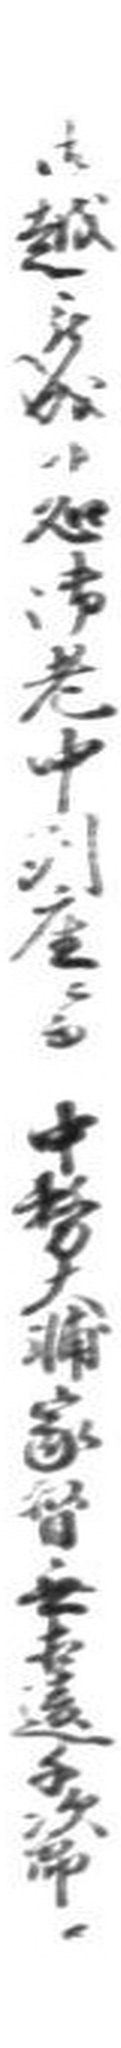御越被成候処御老中列座ニ而中務大輔家督無相違千次郎江
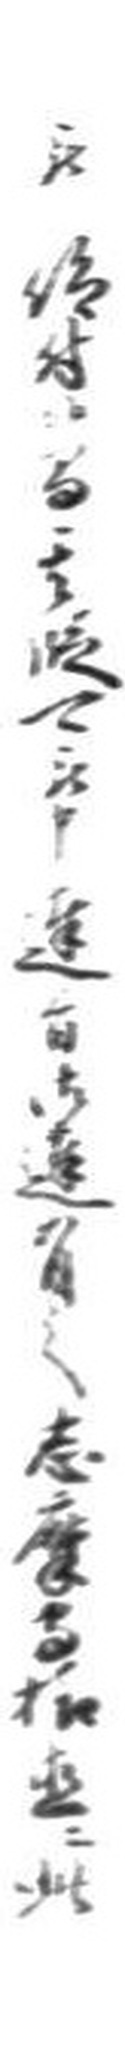被仰付候間其段可被申達旨御達有之志摩守様直ニ此
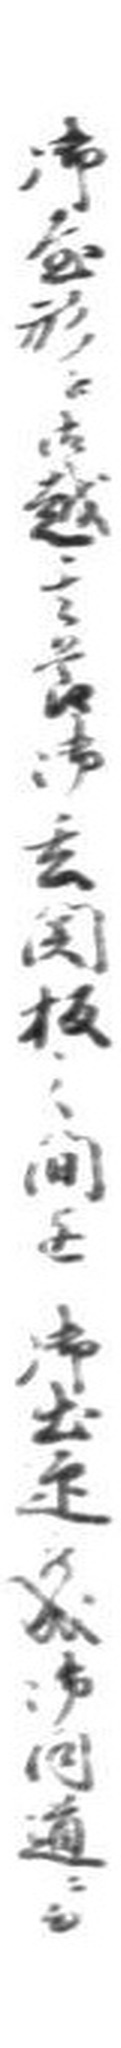御屋形江御越其節御玄関板之間迄御出迎被成御同道ニ而
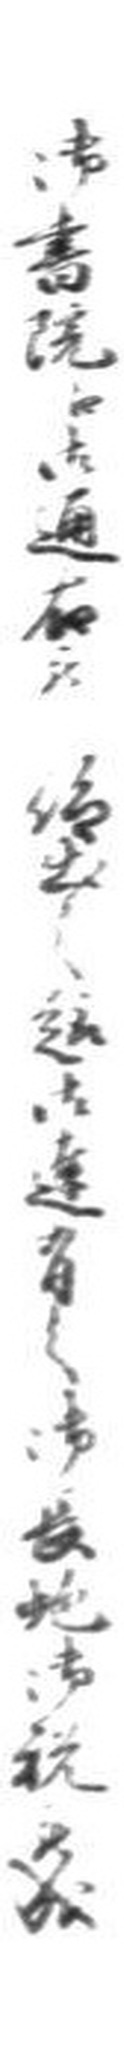御書院江御通右被仰出之趣御達有之御長蚫御祝被成
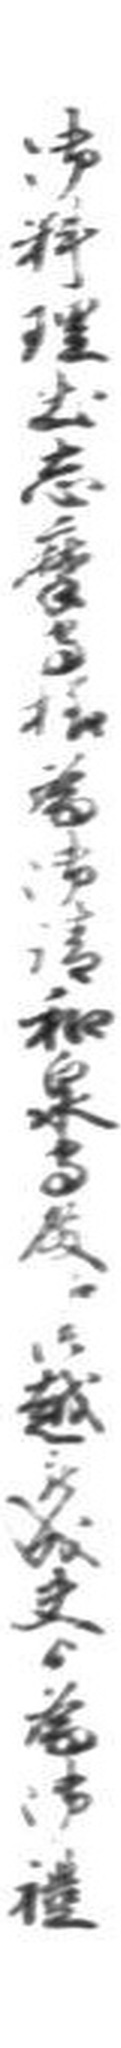御料理出志摩守様為御請和泉守殿江御越被成夫ゟ為御礼

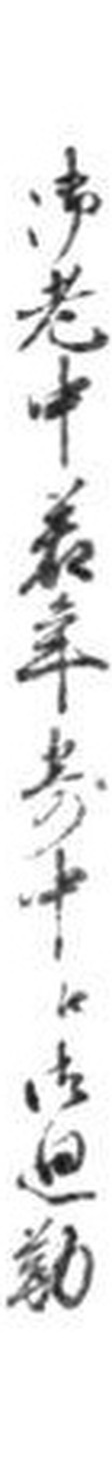御老中若年寄中江御廻勤
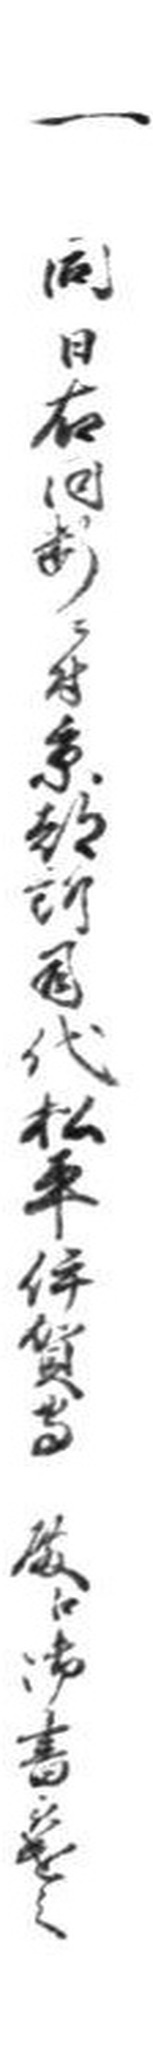一同日右同断ニ付京都所司代松平伊賀守殿江御書被遣之
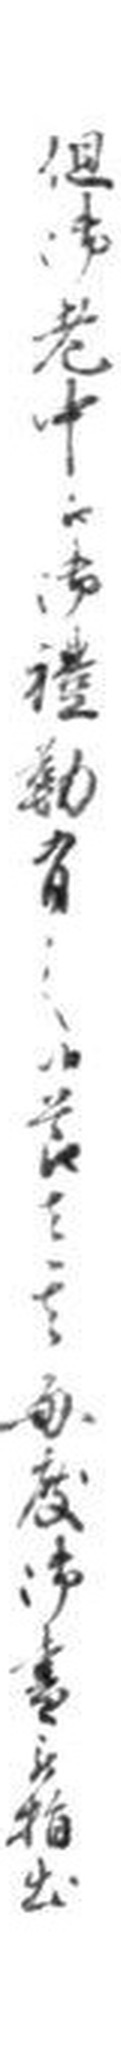但御老中江御礼勤有之候節者其毎度御書被指出
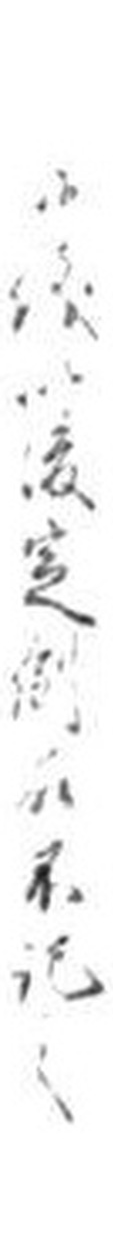候儀以後定例故不記之
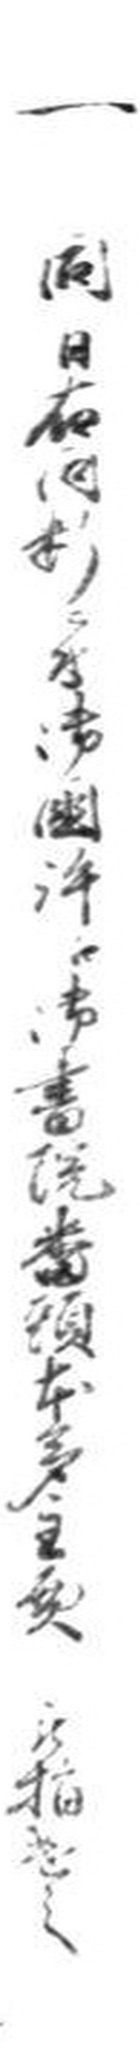一同日右同断ニ付御国許江御書院番頭本多主殿被指遣之
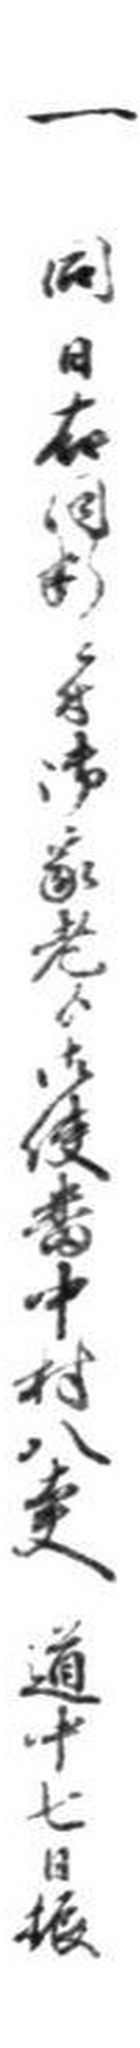一同日右同断ニ付御家老ゟ御使番中村八太夫道中七日振
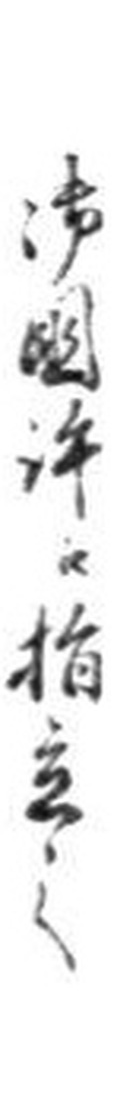御国許江指立之
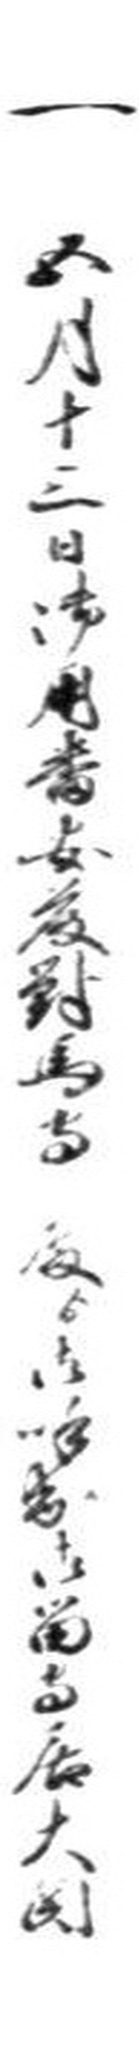一五月十三日御用番安藤対馬守殿ゟ御呼出御留守居大関
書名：家譜 三十八 宗矩公 従享保九年五月到享保九年十二月
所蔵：福井県文書館 Fukui Prefectural Archives
